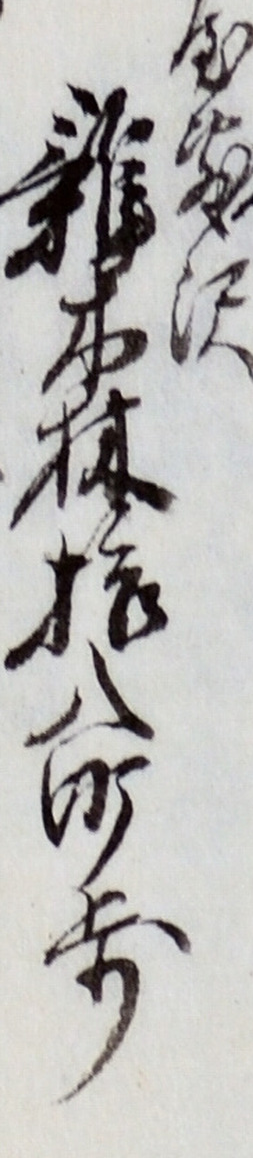雑木林拾八町同断
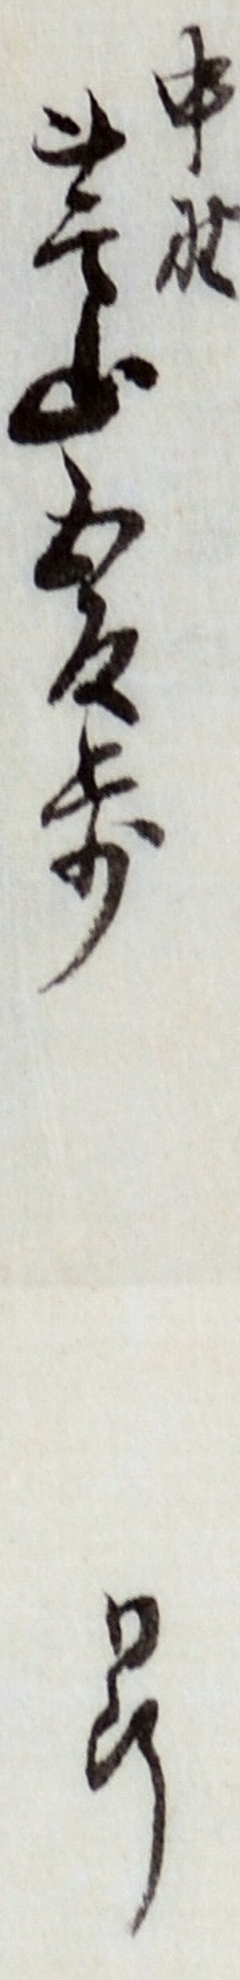芝山五反歩同断
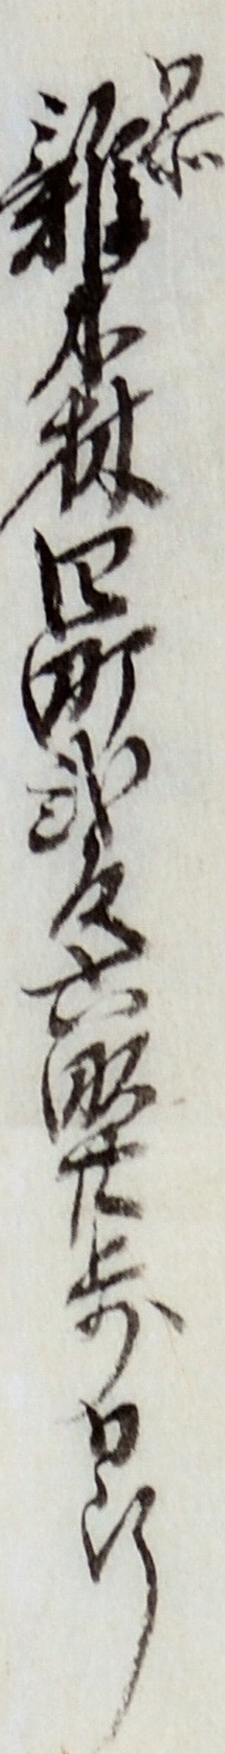雑木林四町弐反六畝廿歩同断

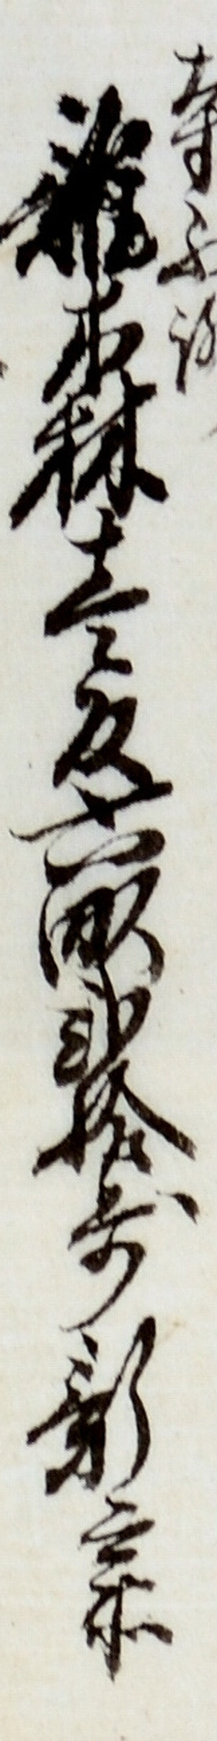雑木林壱反六畝弐拾歩新兵衛
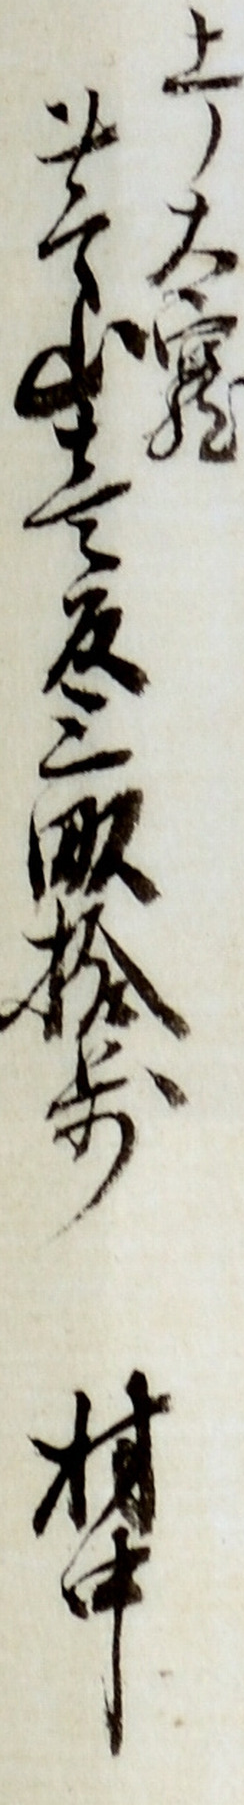芝山壱反三畝拾歩村中
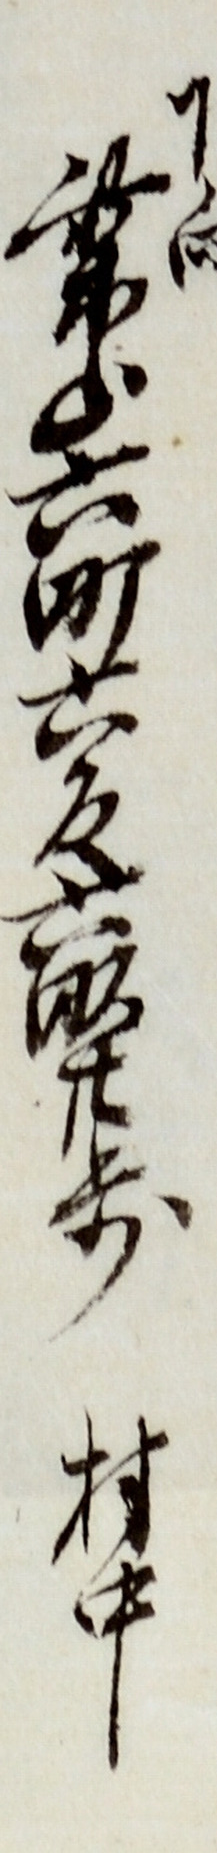柴山六町六反六畝廿歩村中
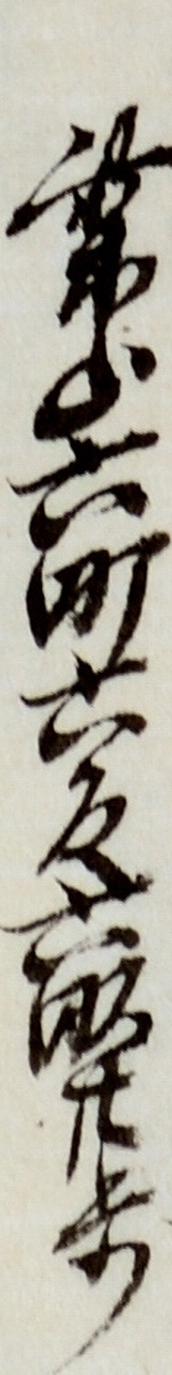柴山六町六反六畝廿歩村中
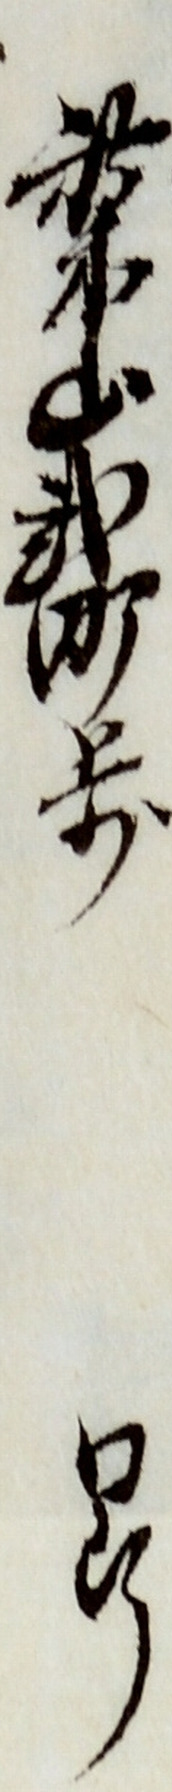柴山弐町歩同断
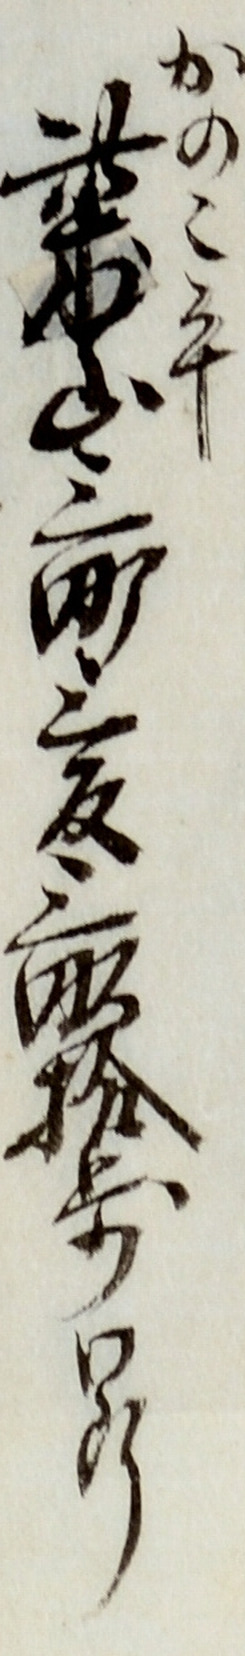柴山三町参反三畝拾歩同断
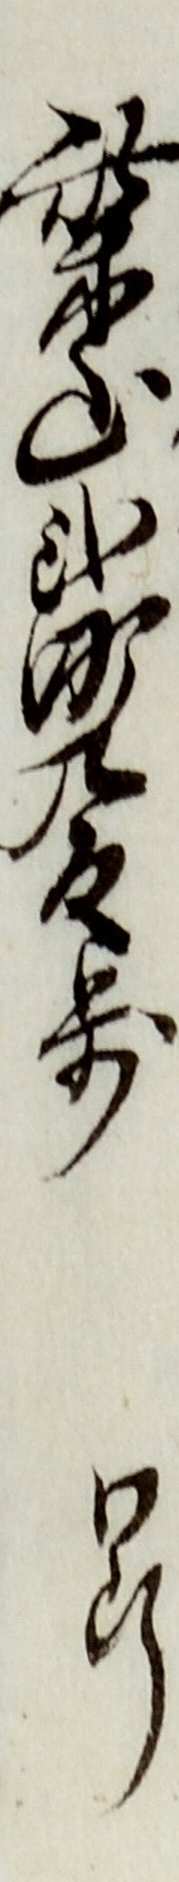柴山弐町九反歩同断
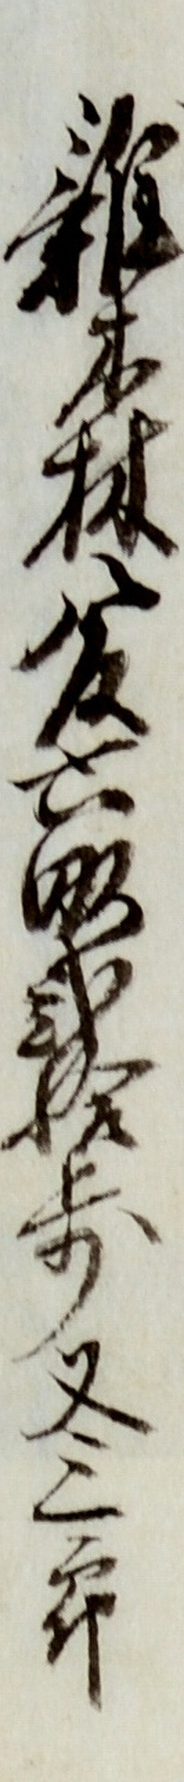雑木林八反六畝弐拾歩又三郎
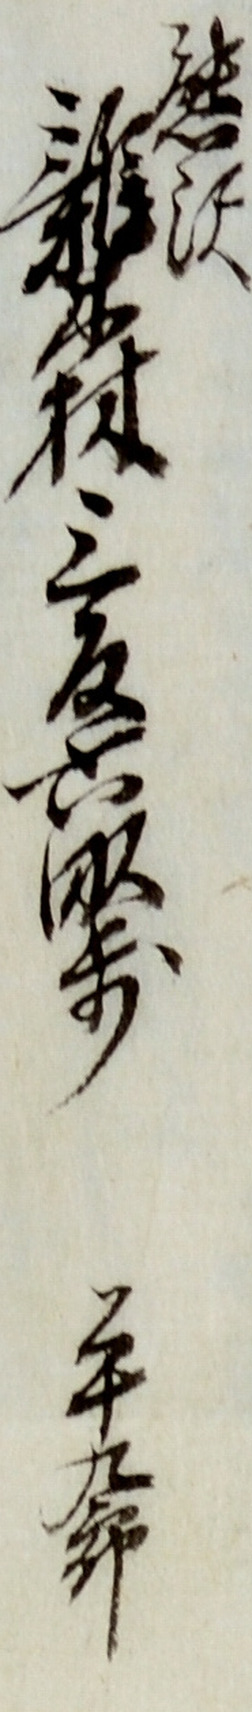雑木林三反六畝歩平九郎

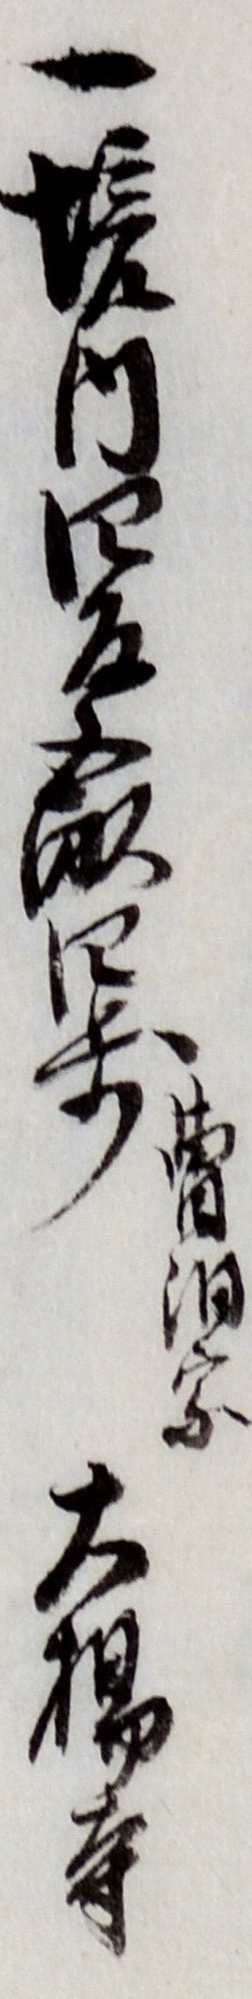一境内四反五畝四歩大揚寺
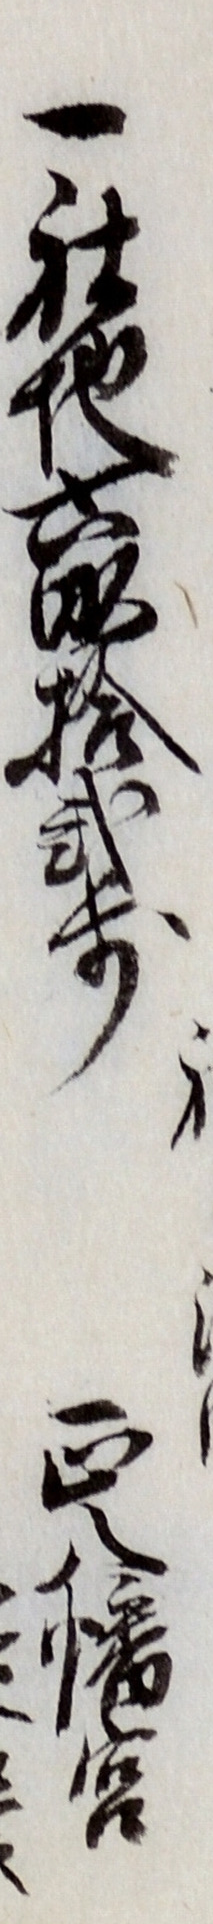一社地六畝拾弐歩正八幡宮
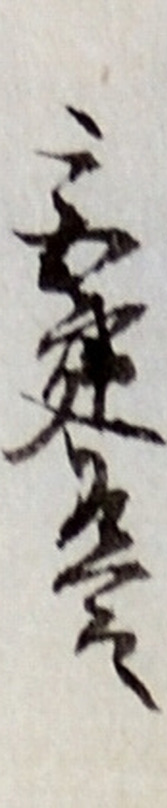宮建有之
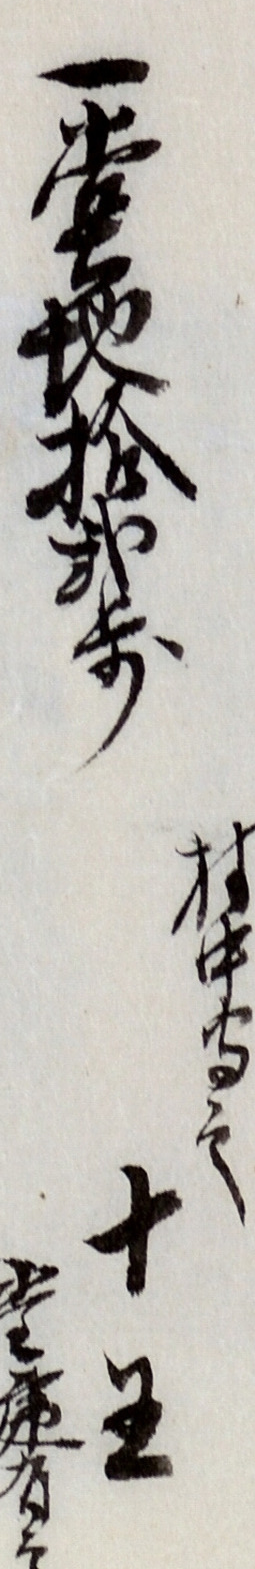一堂地拾弐歩十王
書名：御領分中山林社地手控
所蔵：伊那市立高遠町図書館・合同会社AMANE
